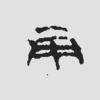雨
